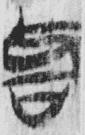○（始）
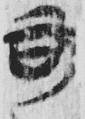可
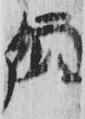凥（處）
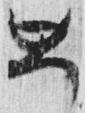也
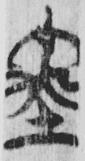○（禹）
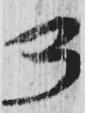乃
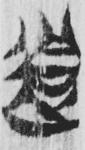迵（通）
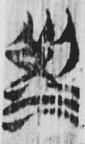○（伊）
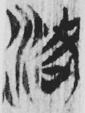洛
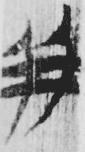並
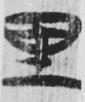里（瀍）
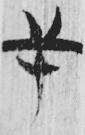干（涧）
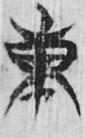東
